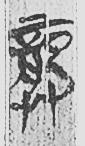{龍廾}
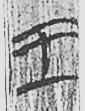王
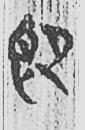即
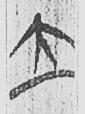立
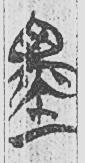墨
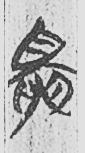要
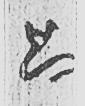也
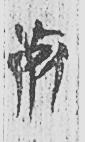死
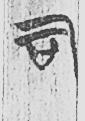司
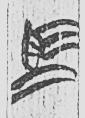馬
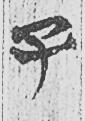子
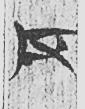反
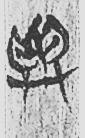與
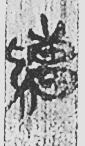{糸東田}
